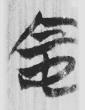{宀𠁩}
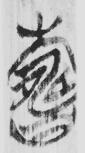壽
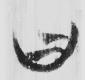曰
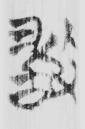敢
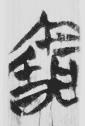{尒䎽}
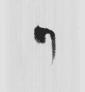人
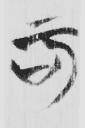可
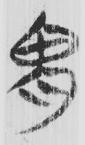胃
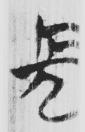長
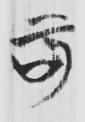可
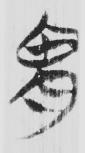胃
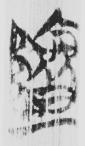險
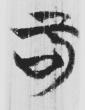可
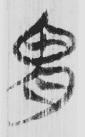胃
